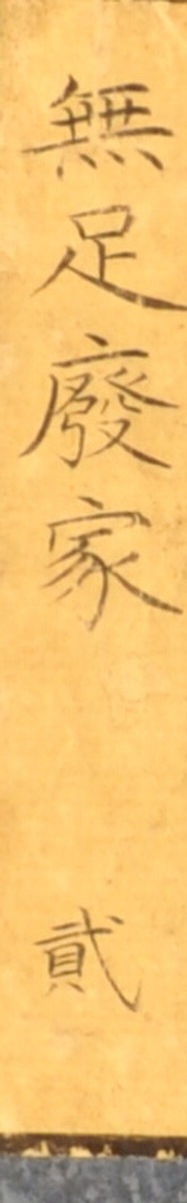無足廃家貮

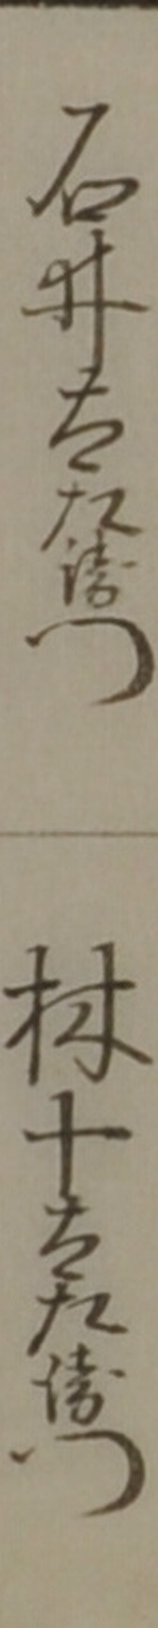石井太左衛門林十太左衛門
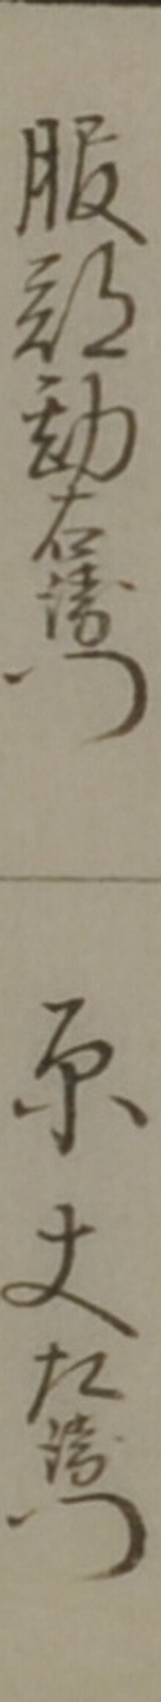服部勘右衛門原丈左衛門
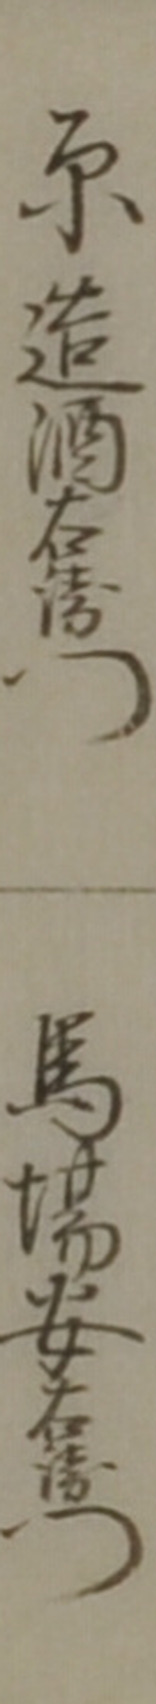原造酒右衛門馬場安右衛門
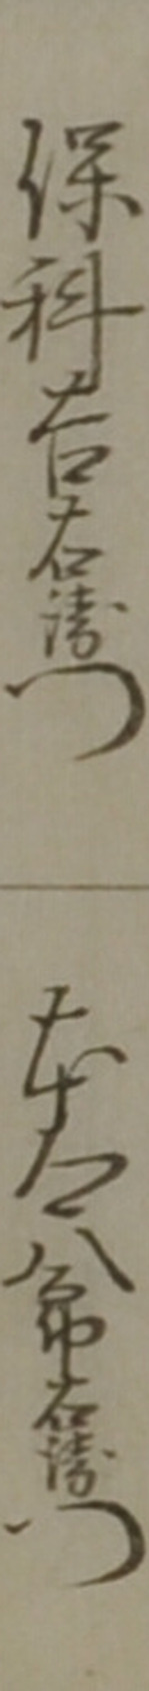保科吉右衛門本郷八郎右衛門

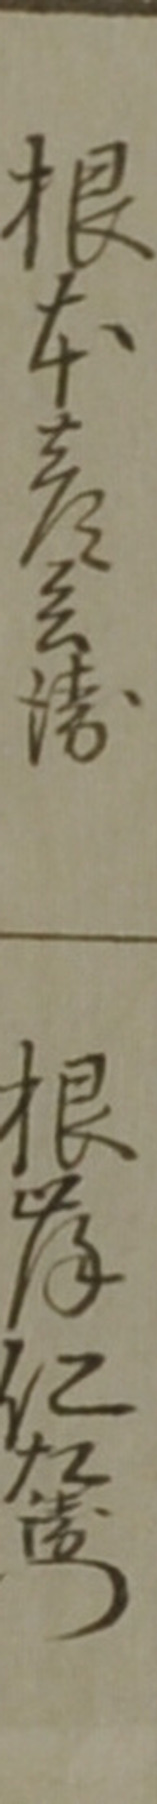根本彦兵衛根岸仁左衛門
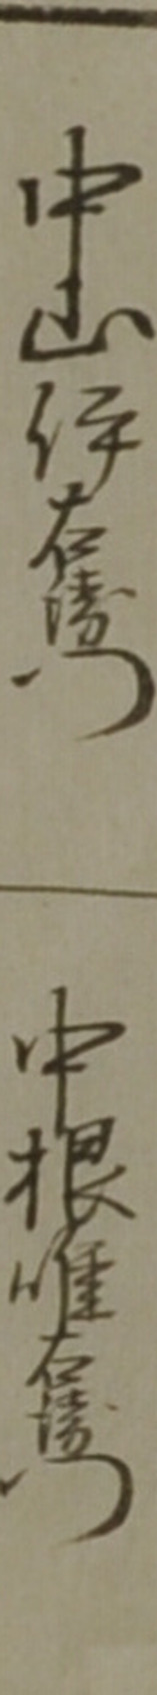中山伊右衛門中根唯右衛門
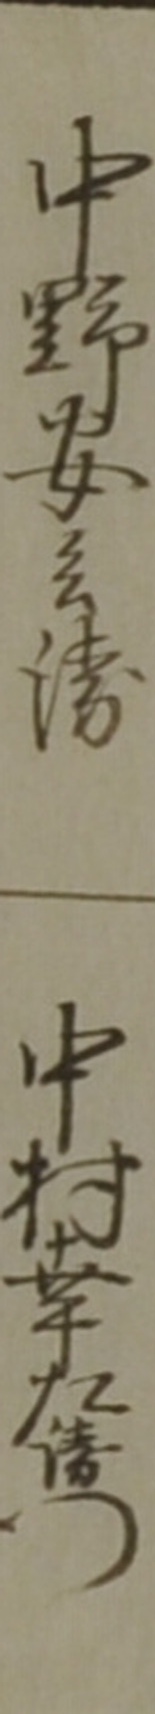中野安兵衛中村幸左衛門

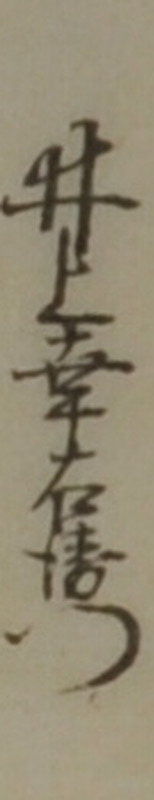井上幸右衛門
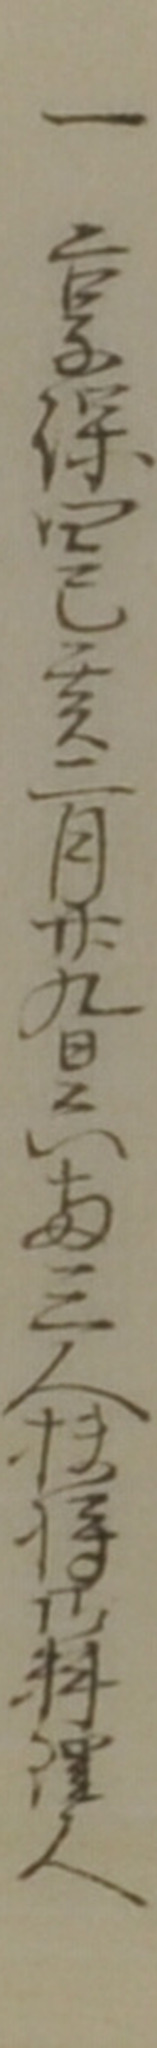一享保四己亥二月廿九日六両三人扶持御料理人
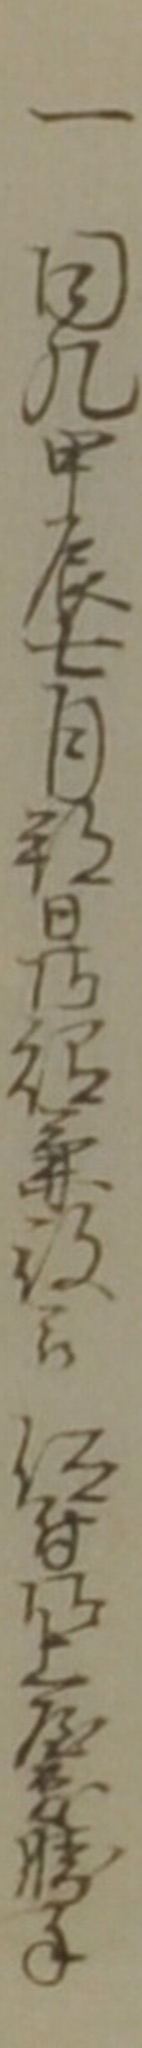一同九甲辰七月朔日御紹兼役被仰付御上屋敷勝手
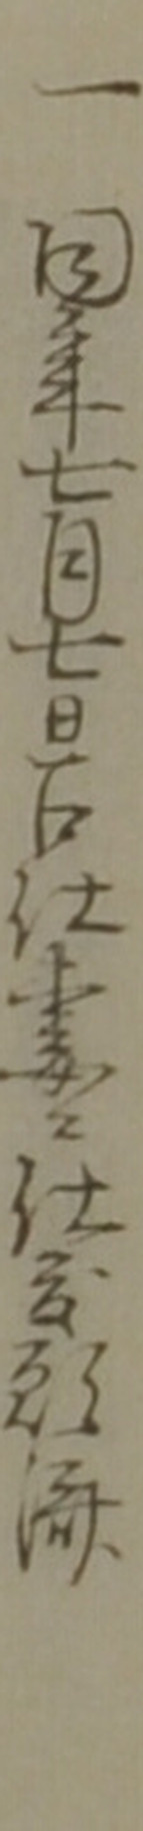一同年七月七日召仕妻仕度願済
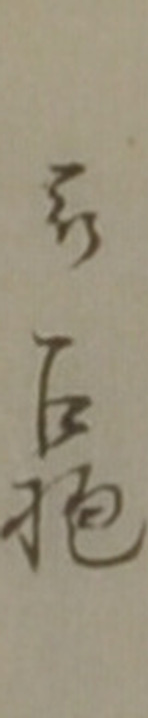被召抱
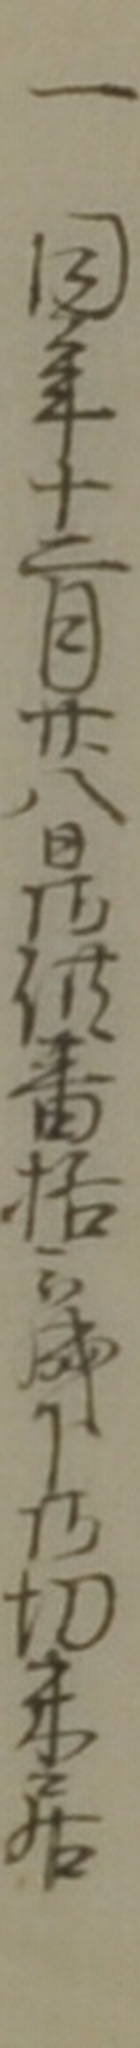一同年十二月廿八日御供番格被成下御切米居
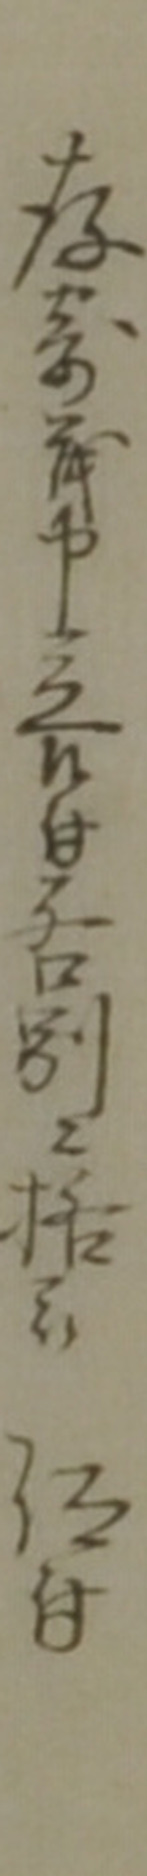存寄茂申立候付各別格被仰付

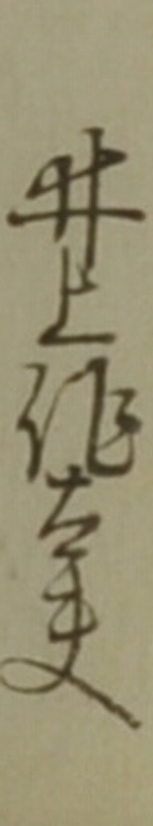井上作太夫
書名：無足廃家（弐）
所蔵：伊那市立高遠町図書館・合同会社AMANE
